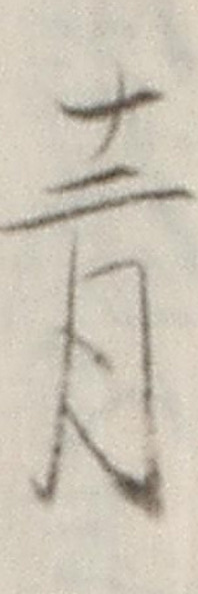十二月

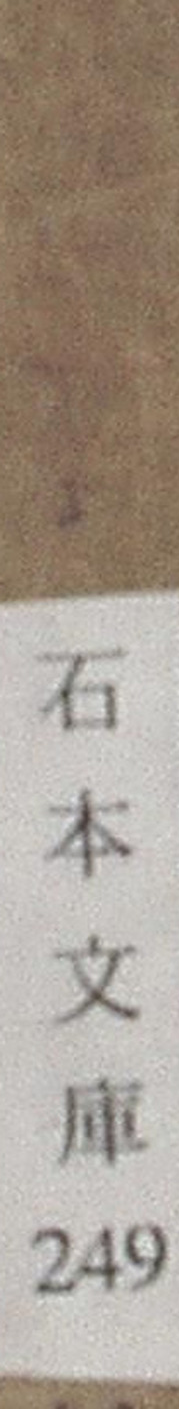石本文庫
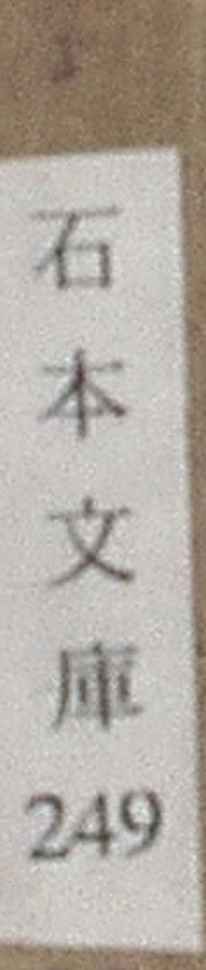石本文庫
